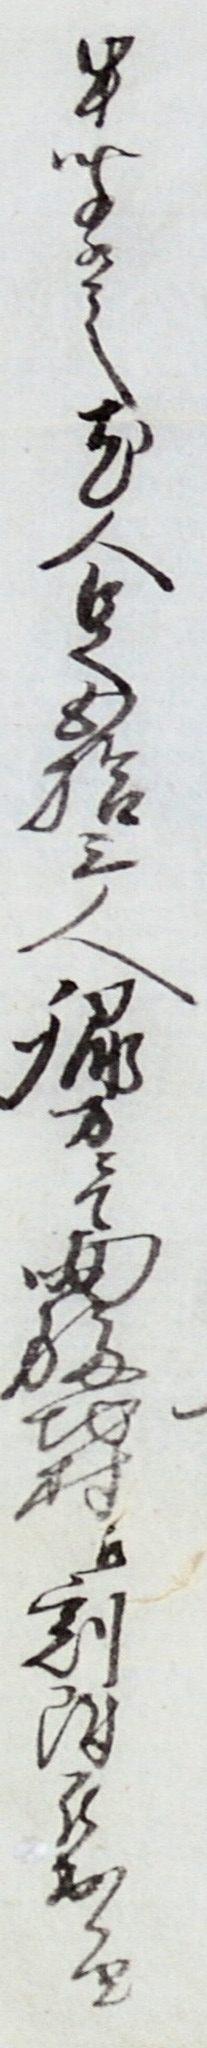申聞有之尤人足五拾三人帰方ニて両地村江割附罷出候由

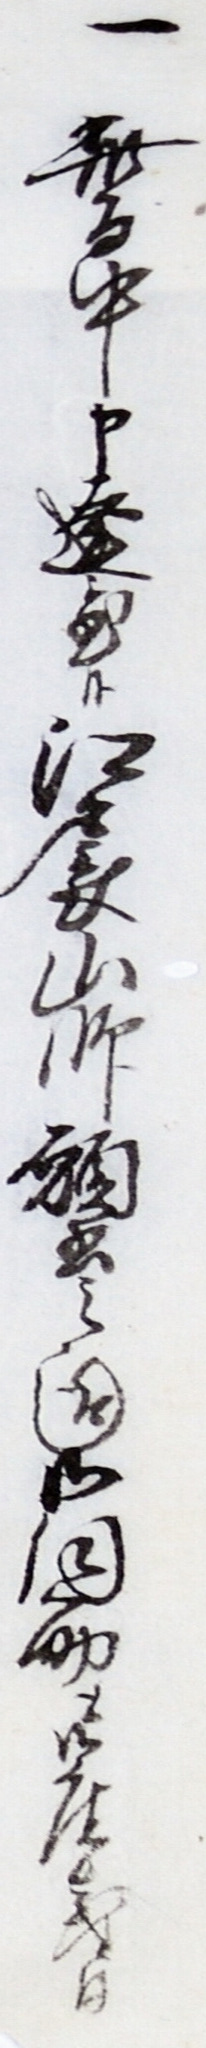一無事申達至候江戸表山師願書之趣御同筋ニ御座義ニ付
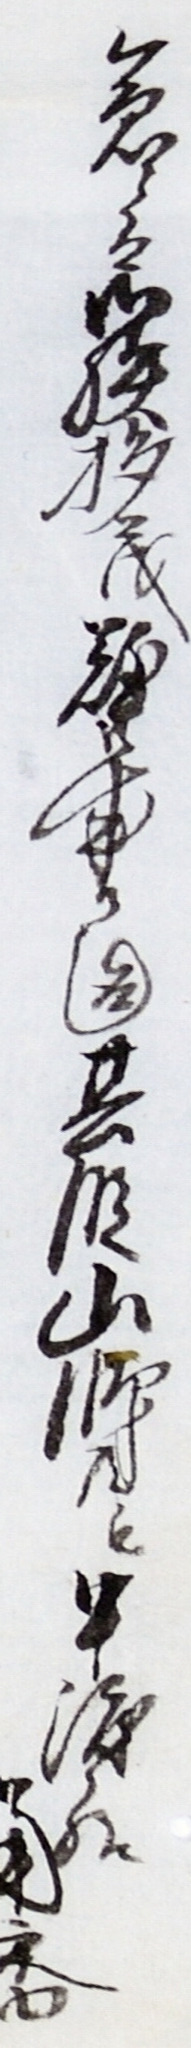急ニ而御挨拶も難成之趣其段山師共江申渡候様
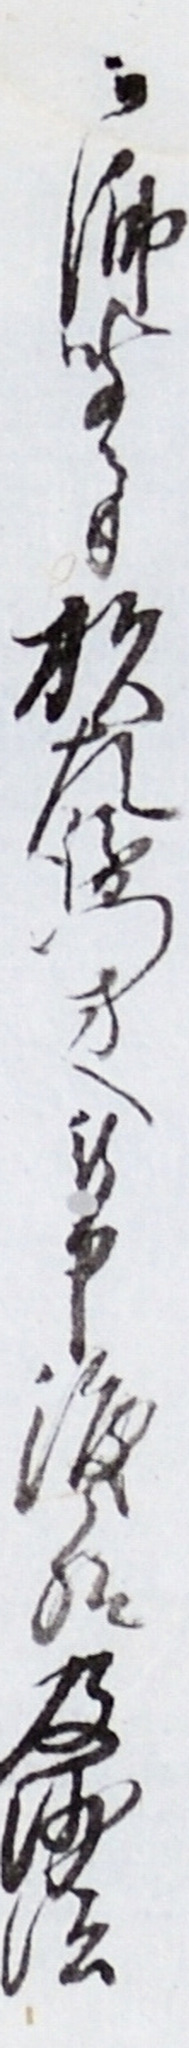被仰聞ニ付杉左衛門方へ被申渡候様及沙汰
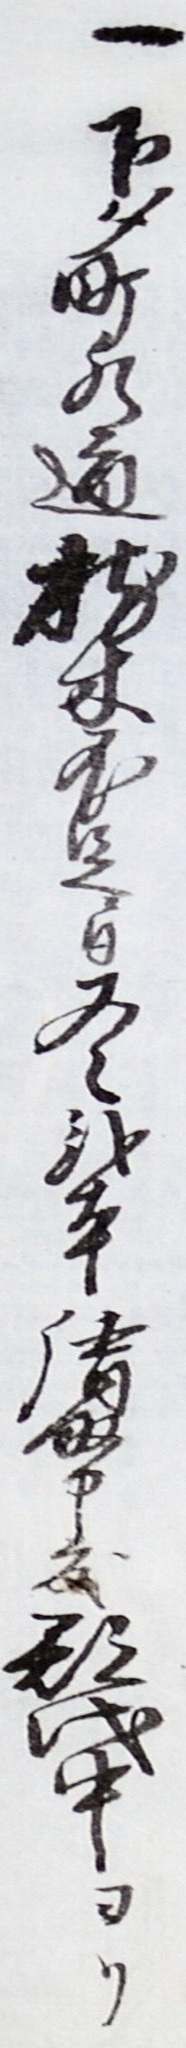一下〆町水通材木不足ニ付又々弐請取申候義郡代中ヨリ
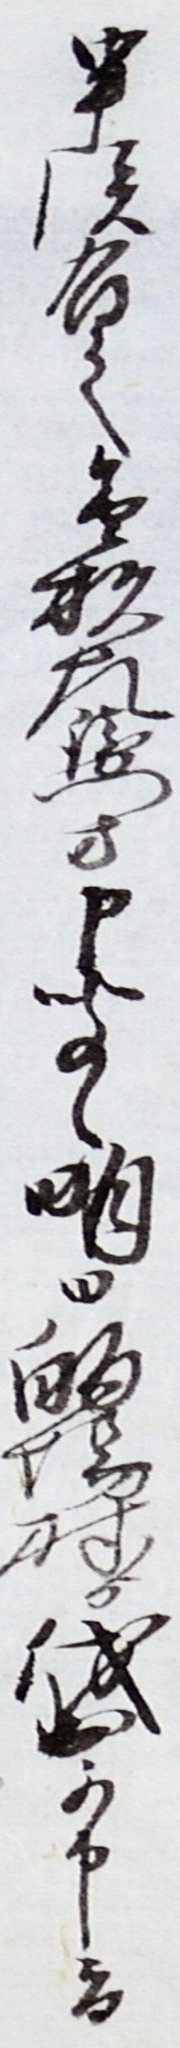申談有之候節杉左衛門方申聞候明日的場村より伐出可申旨
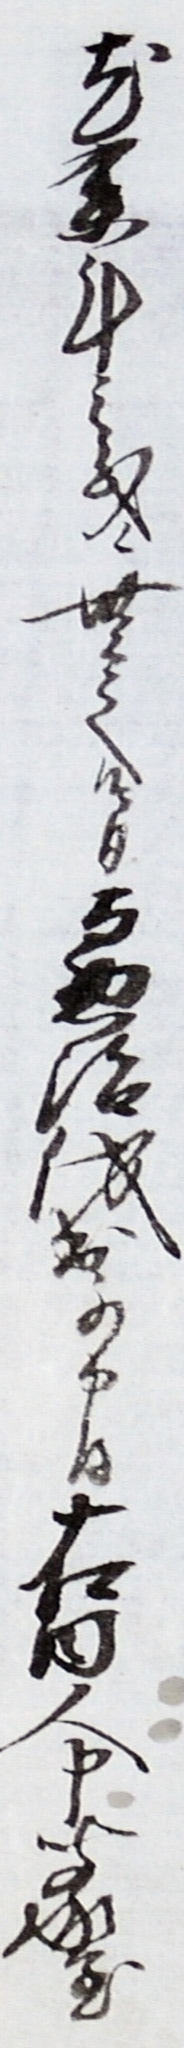尤夏斗之義は無之候ニ付与惣治伐出可申付右同人申聞承置
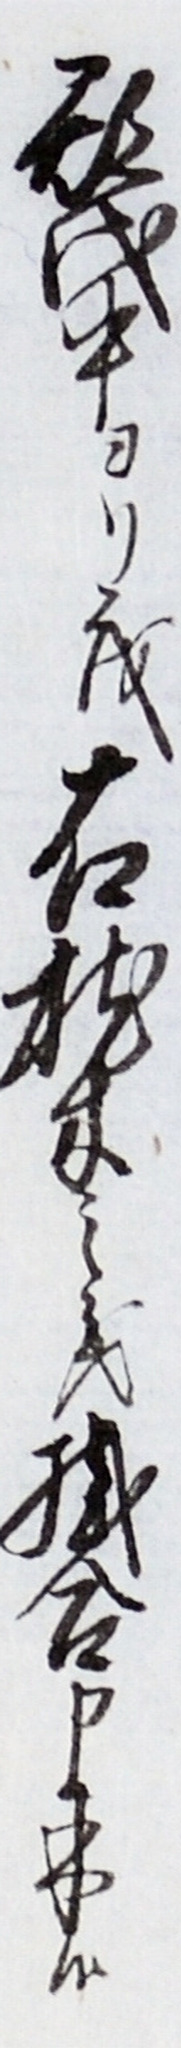郡代中ヨリも右材木之義掛合申来候
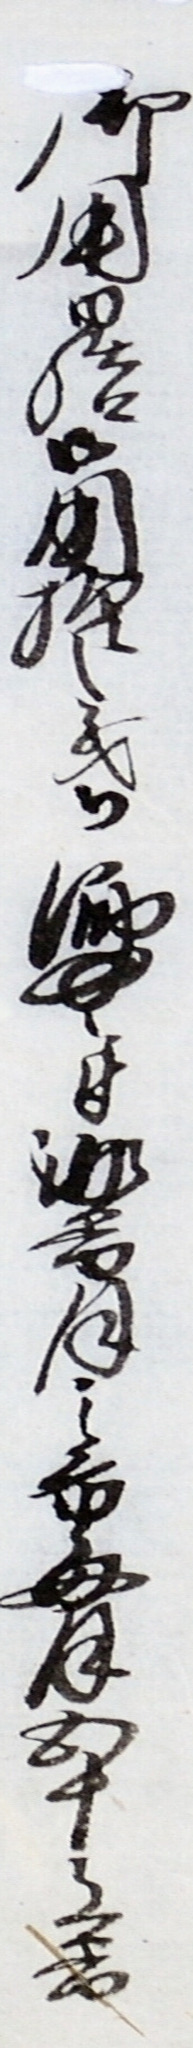一御用日給御用捨之義被仰出候ニ付番月番之番毎月五十番
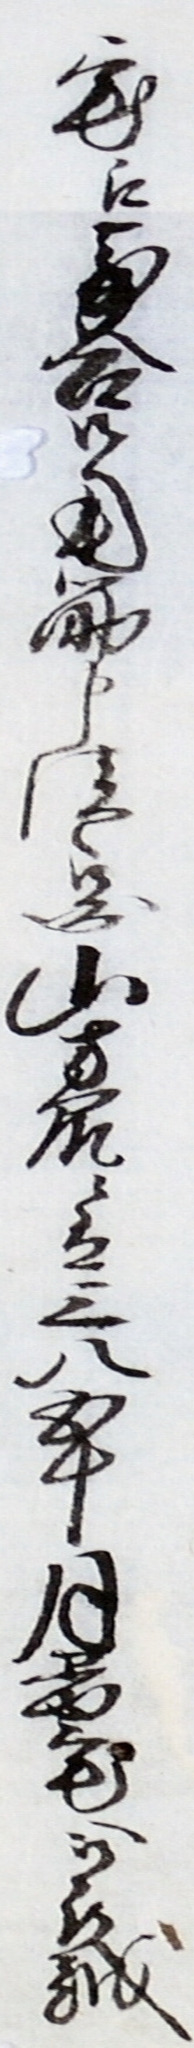宅江寄合御用筋申談之図山方衆ニは三八五十月番宅へ御罷越
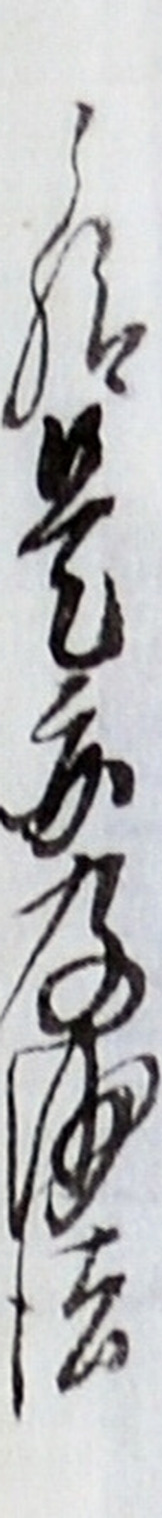候様是亦及沙汰
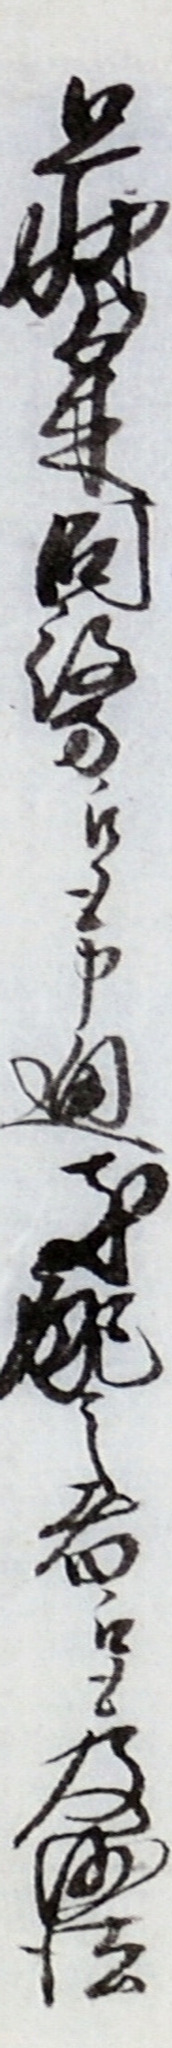廻状出来同役方江も申通支配之者江も及沙汰
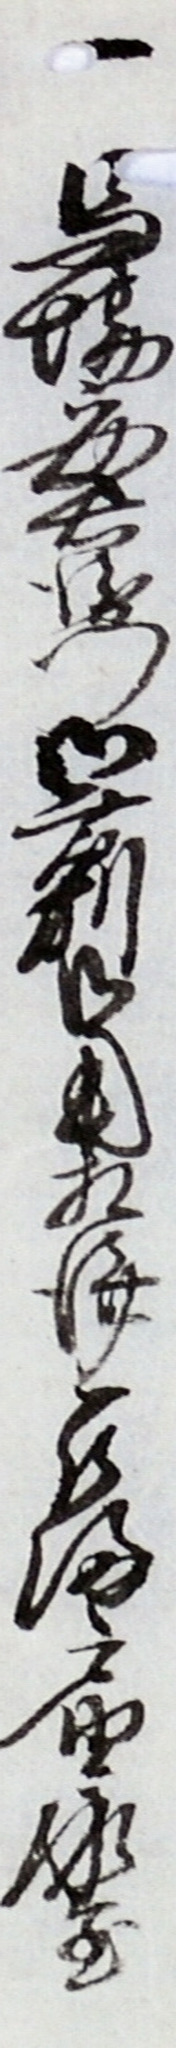一馬場安右衛門御薪御用相済罷帰御届承置
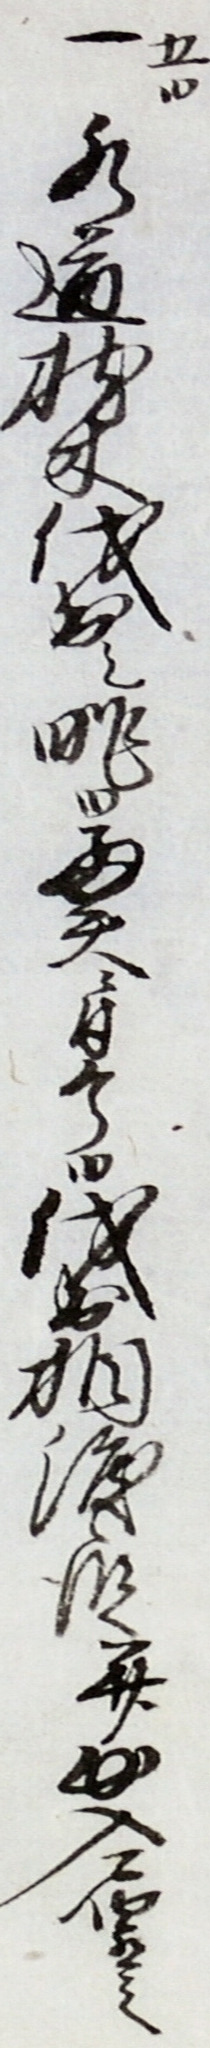一水道材木伐出し昨日雨天ニ付今日伐出相渡候段并出入届有之
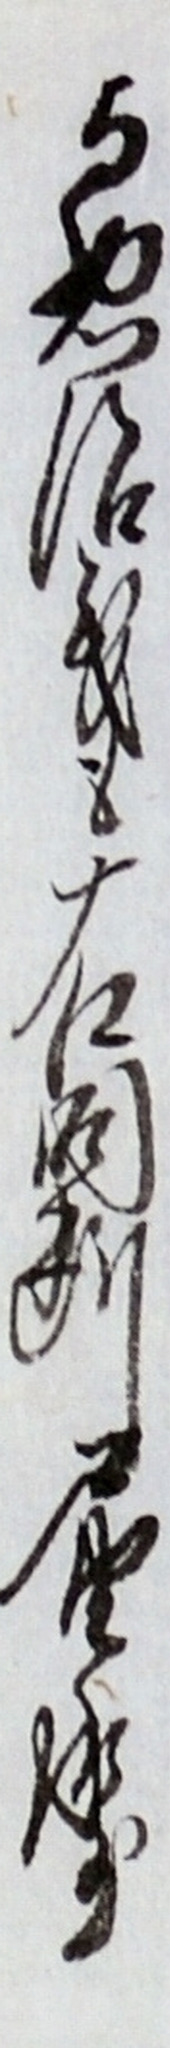与惣治義も右同断届承置
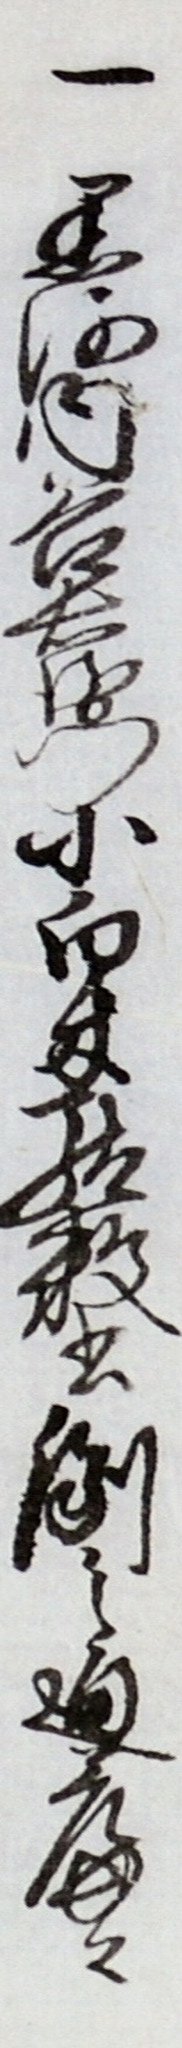一黒河内善右衛門小白木駄数書例之通差出ス
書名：御山奉行御用控
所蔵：伊那市立高遠町図書館・合同会社AMANE
